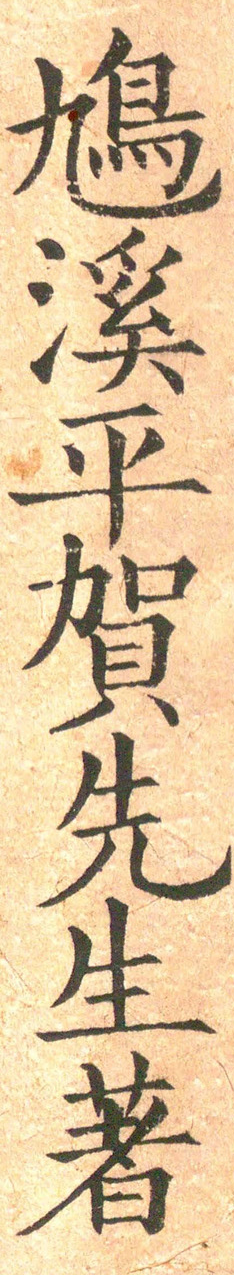鳩溪平賀先生著
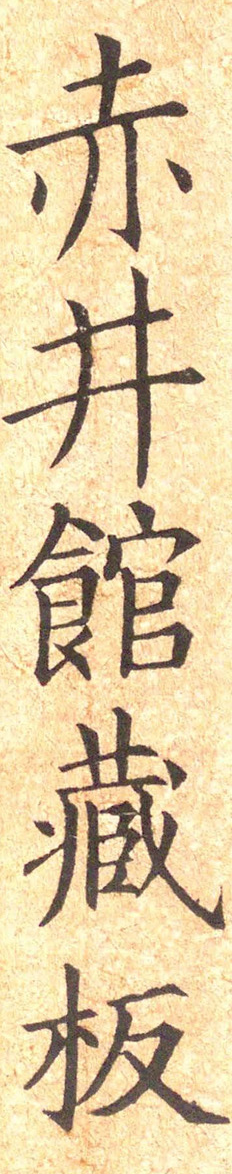赤井館蔵板
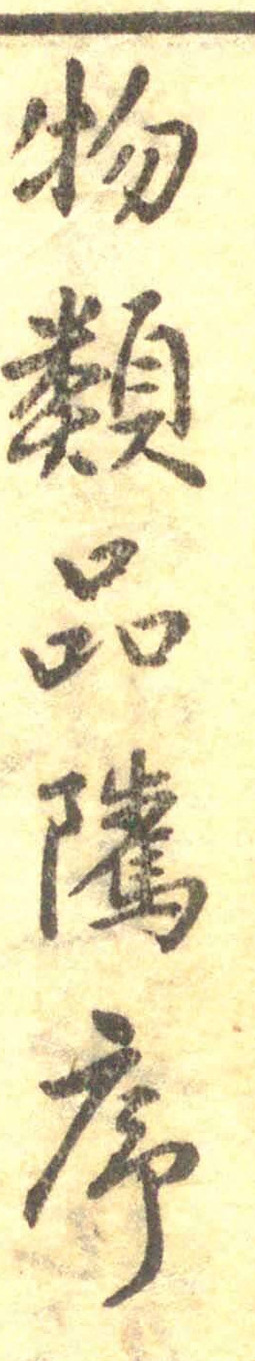物類品隲序
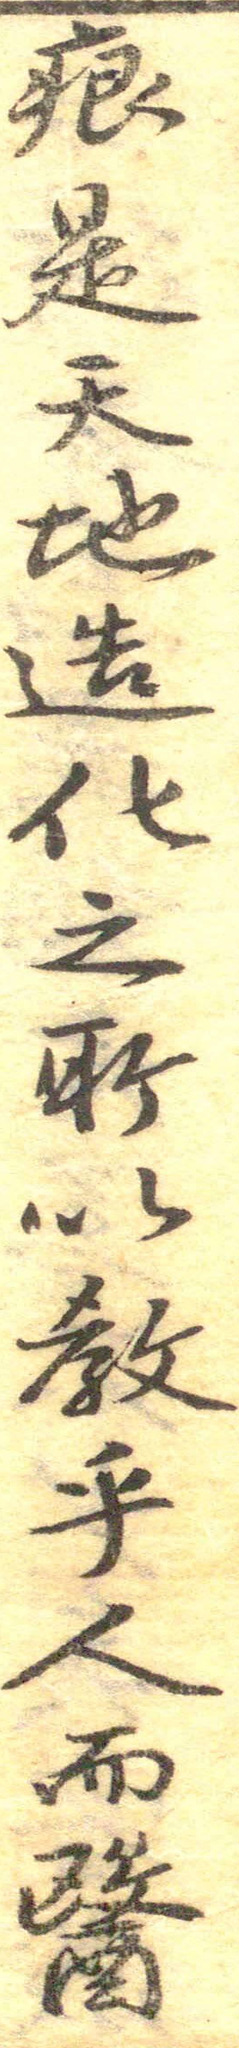痕是天地造化之所以教乎人而医
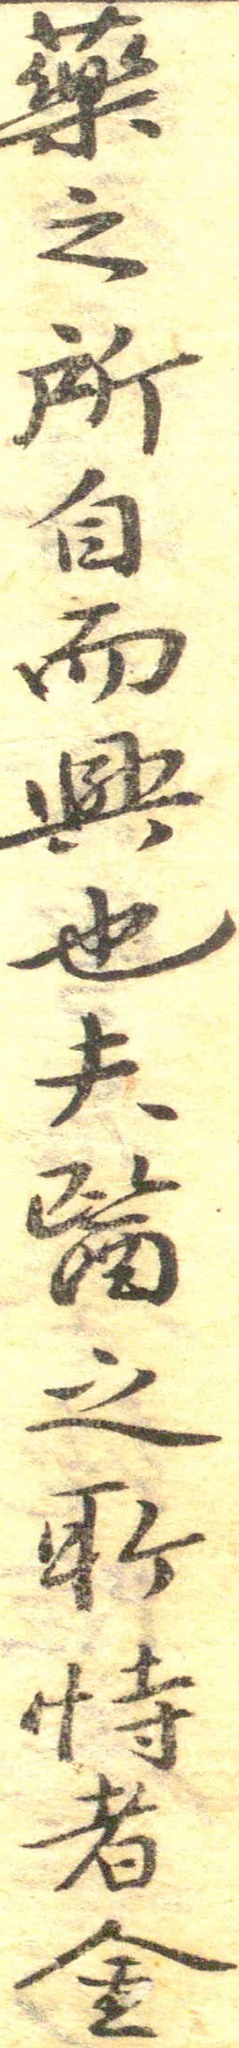薬之所自而興也夫医之所特者金
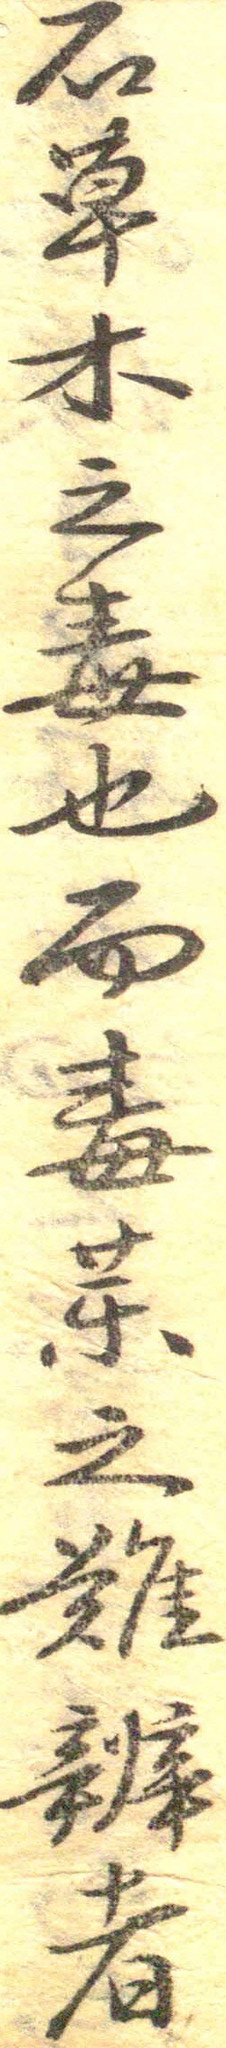石草木之毒也而毒薬之難弁者
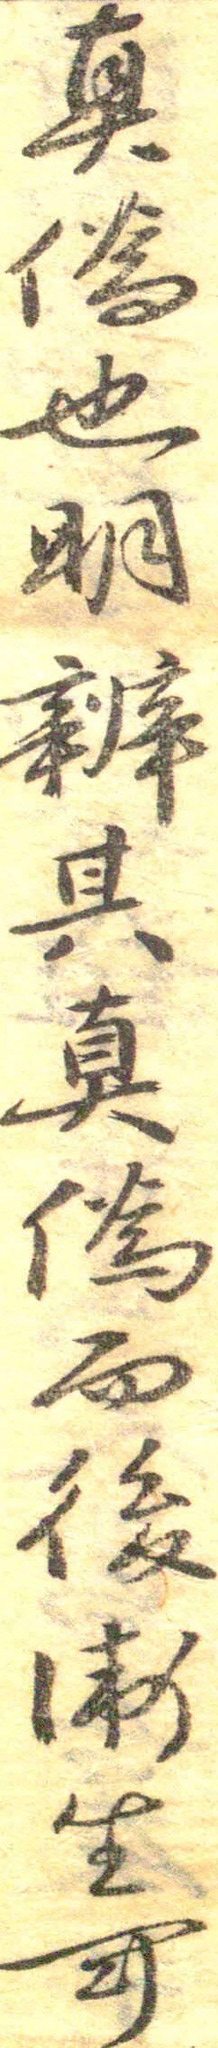真偽也明弁其真偽而後漸生可

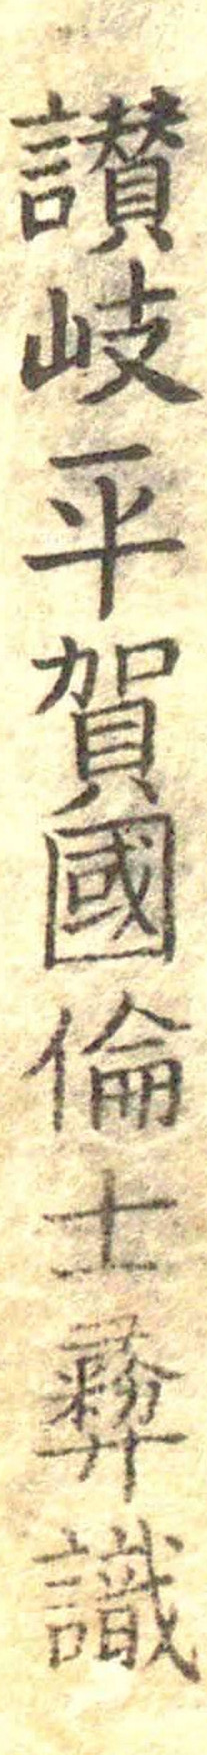讃岐平賀国倫士彝識
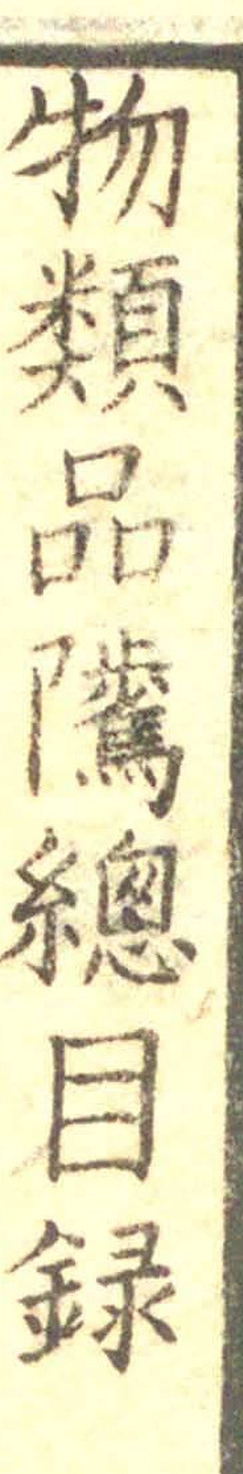物類品隲総目録
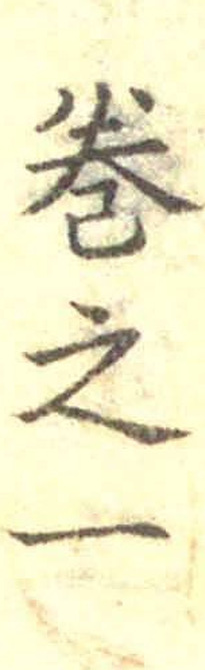巻之一
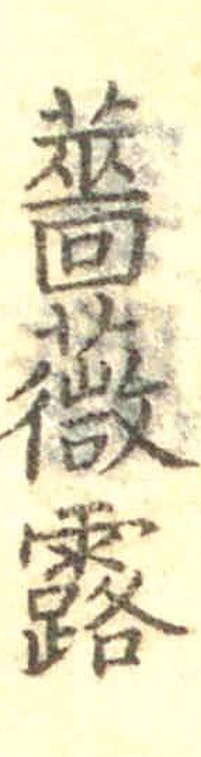薔薇露

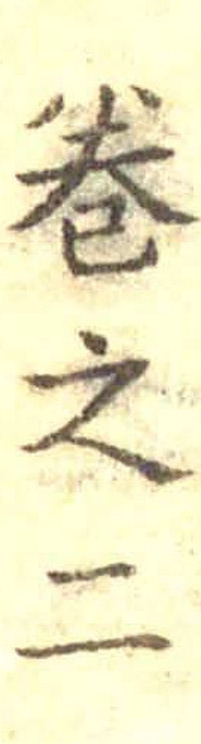漢之二

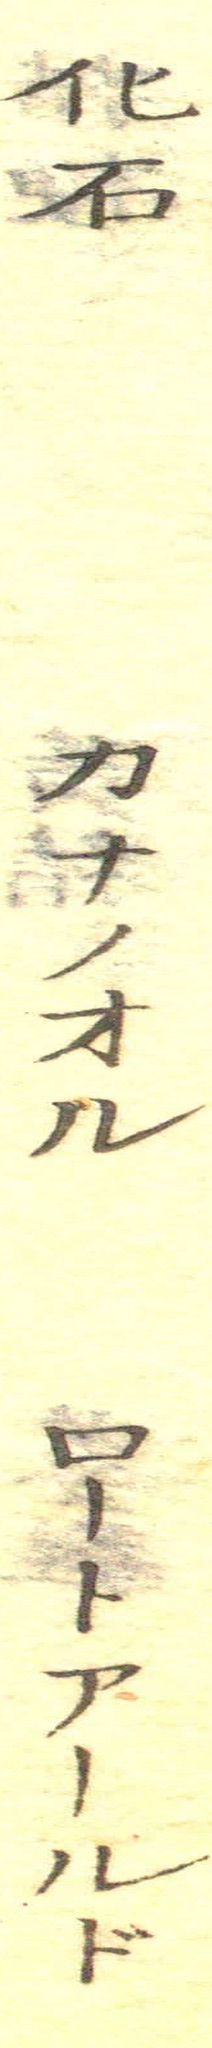化石カナノオルロートアールド
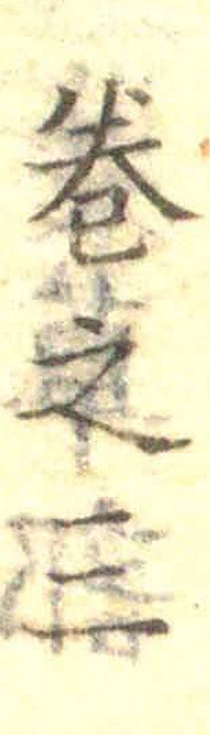巻之三

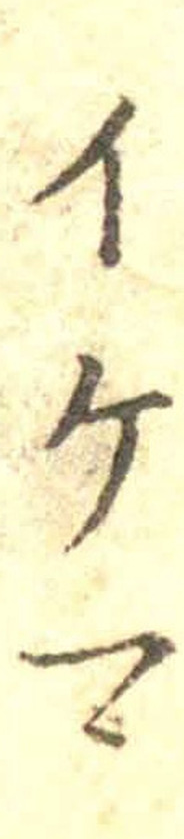イケマ
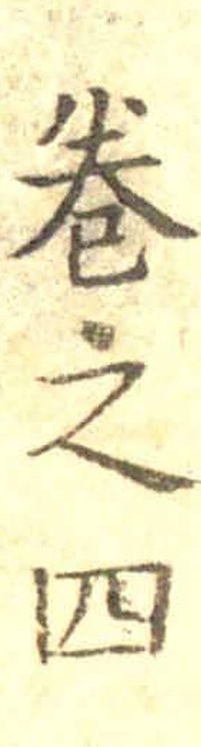巻之四
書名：物類品隲
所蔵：国文学研究資料館
